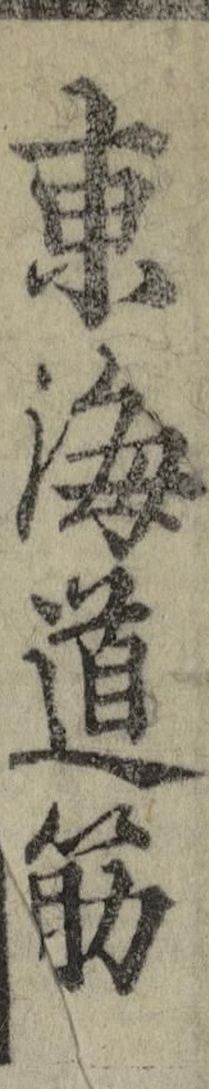東海道筋
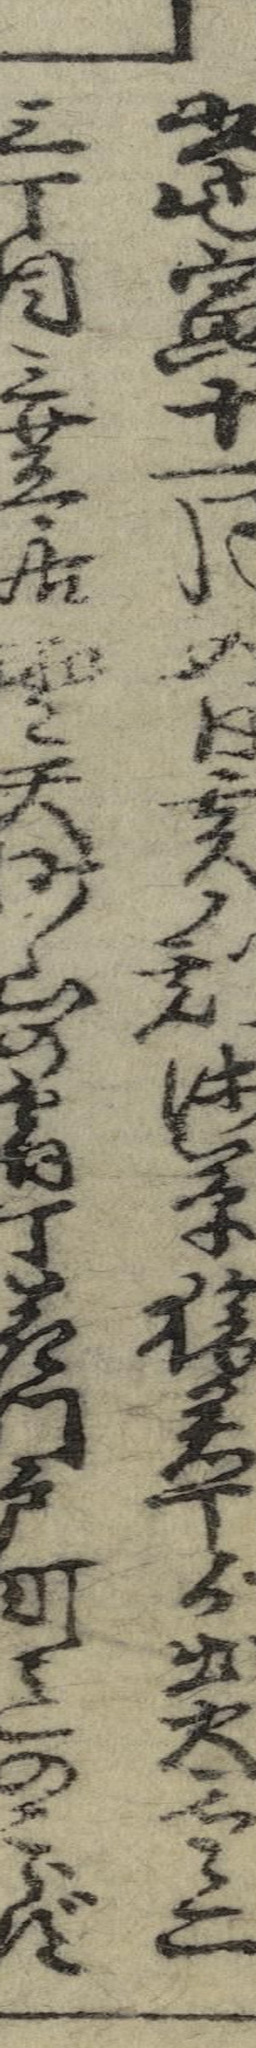三丁目三芝居聖天町山の宿丁表門戸町迄のこらず
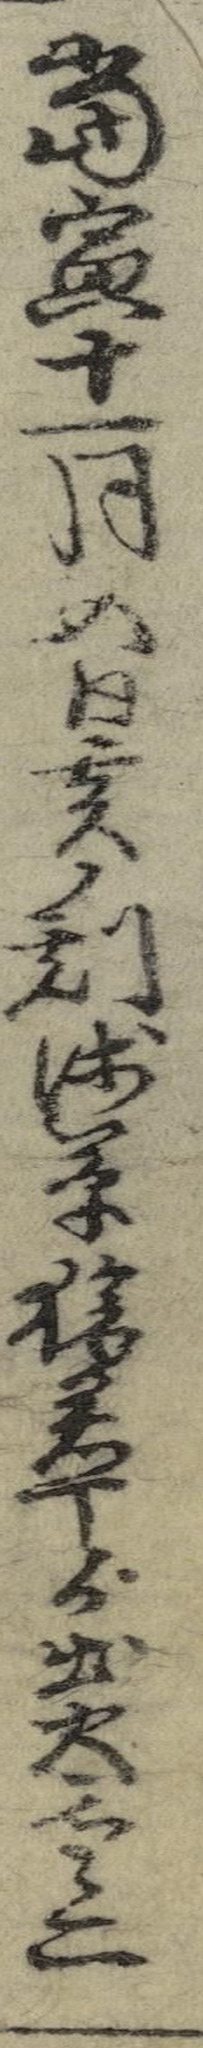当寅十一月五日亥ノ刻浅草猿若丁ゟ出火壱ニ
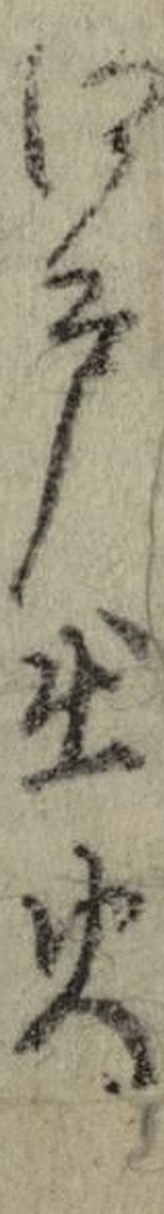江戸出火
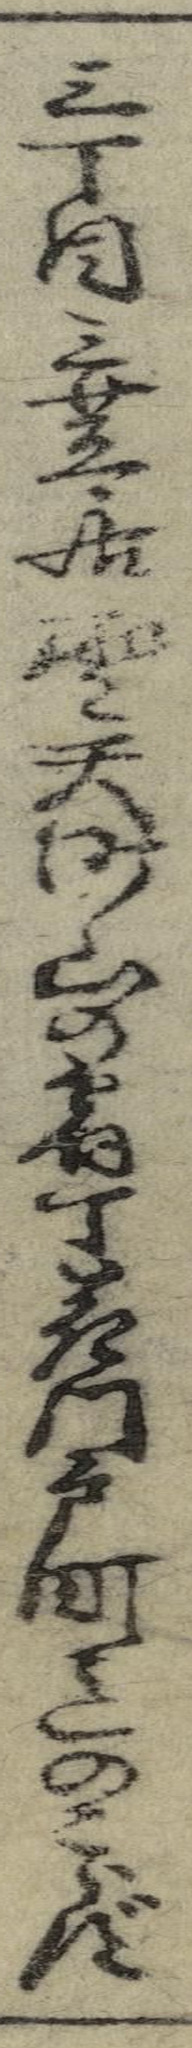三丁目三芝居聖天町山の宿丁表門戸町迄のこらず
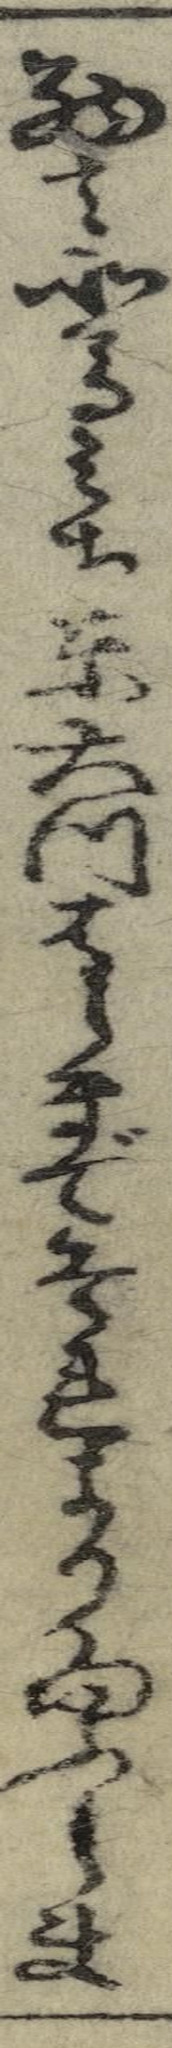西は北馬みち東大川はしまでそれより向ふしま
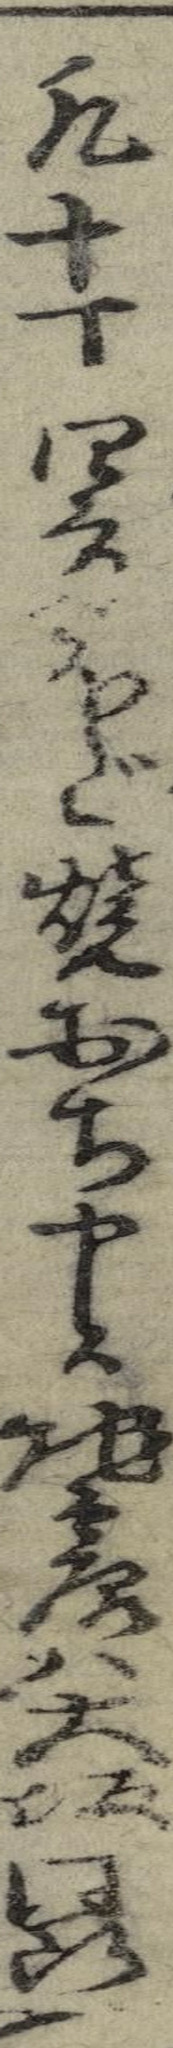凡十丁四方ほど焼けおち申候地震は大坂同断
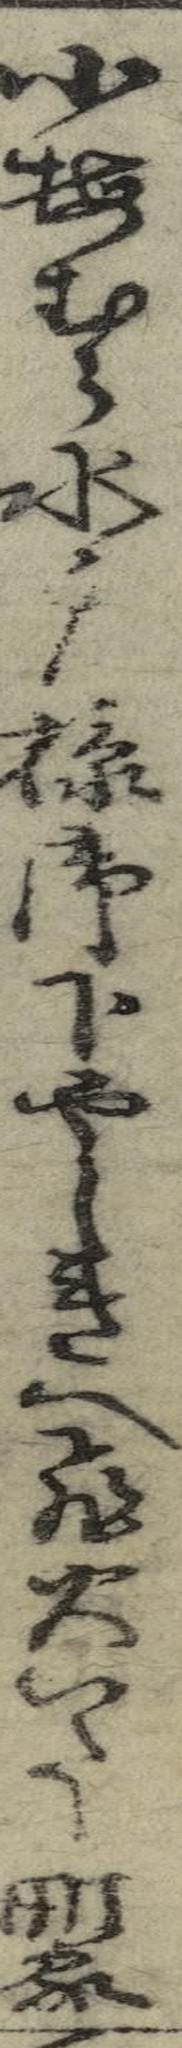小梅むら水戸様御下やしきへ飛火いたし町家
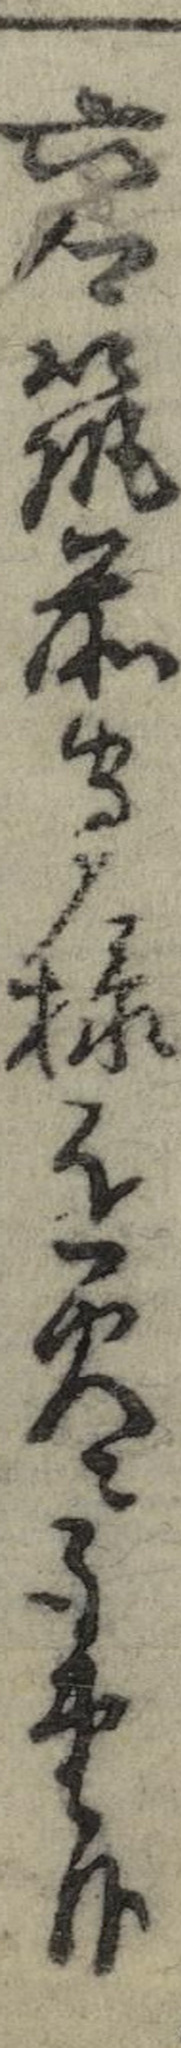六郷筑前守様近火に御座候
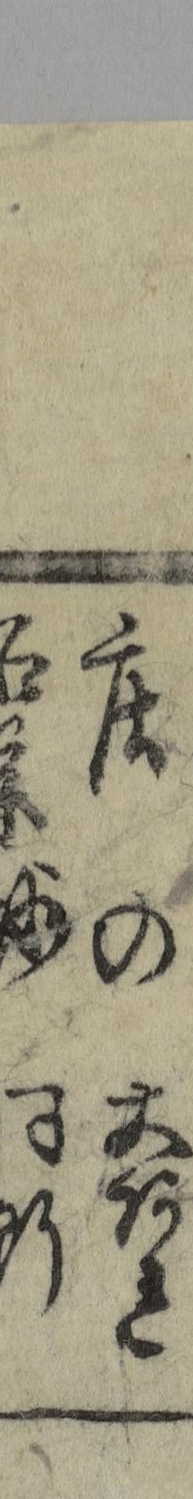庄の大あれ
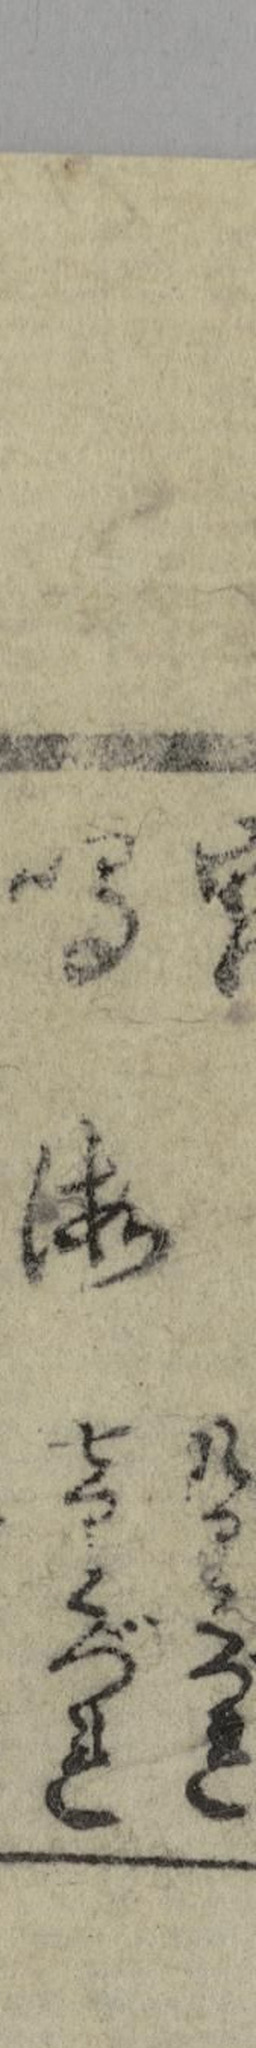鳴海七部くづれ
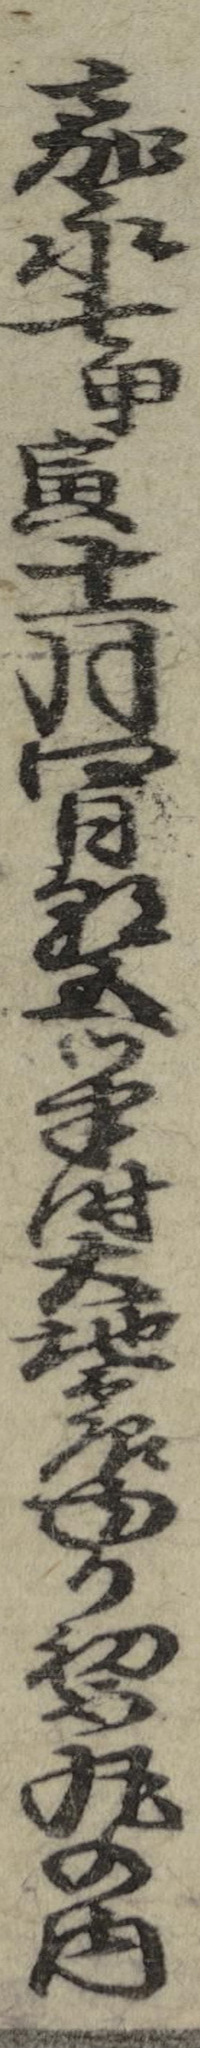嘉永七甲寅十一月四日朝五ツ半時大地震ゆり初め丸の内
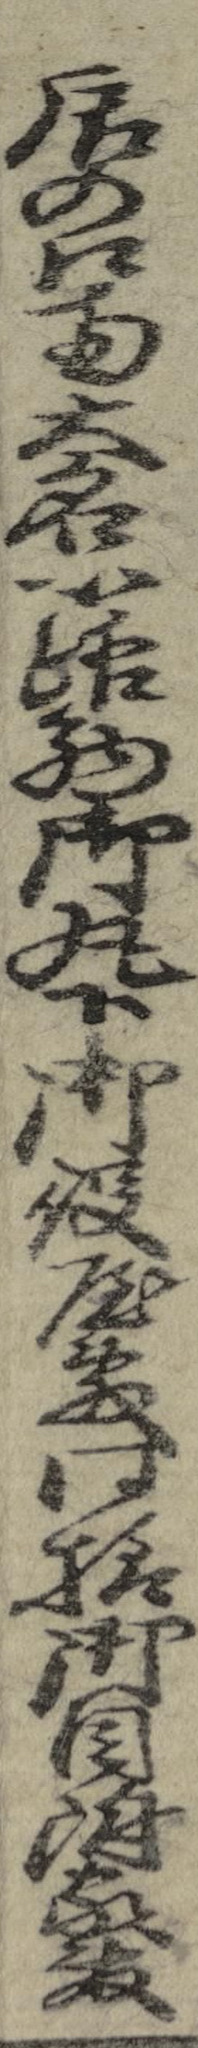辰の口南大名小路西御丸下御役屋敷同様御目附家敷
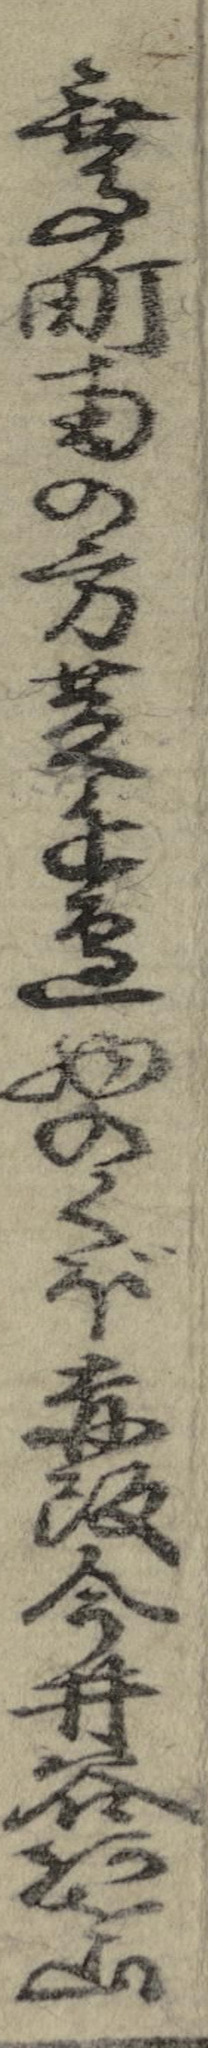無事町南の方芝近辺西のくぼ赤阪今井谷あを山
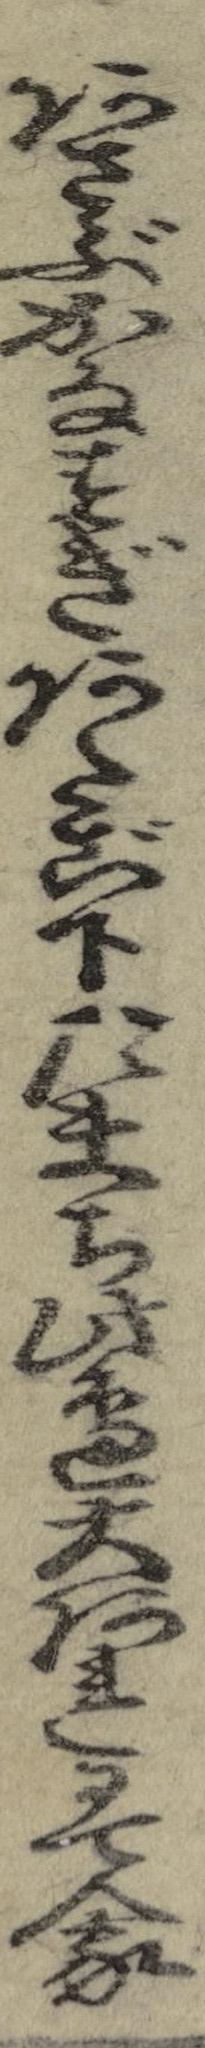あさぶかなすぎあたご下たまち此辺大あれにて人家
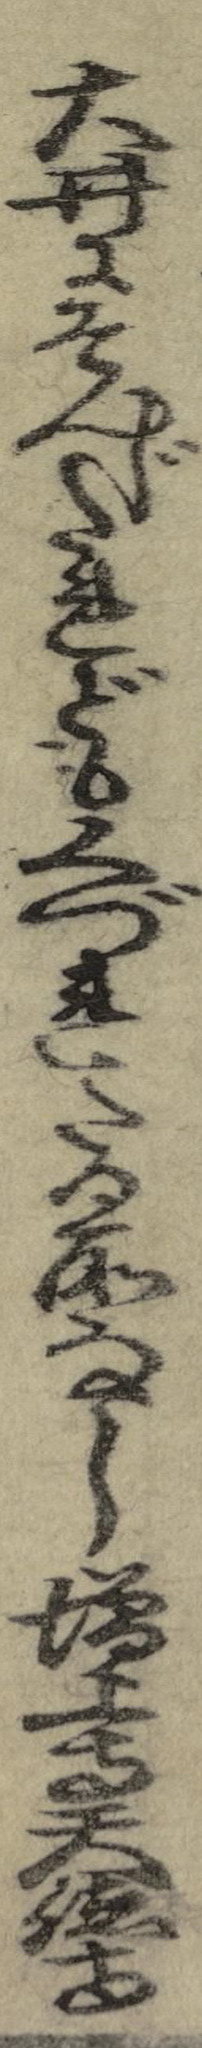大井にそんじたれどもくづれたる所なし増上寺天徳寺
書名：江戸大地震出火之圖本しらべニ仕候
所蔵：東京大学地震研究所図書室 Earthquake Research Institute Library, The University of Tokyo, JAPAN
